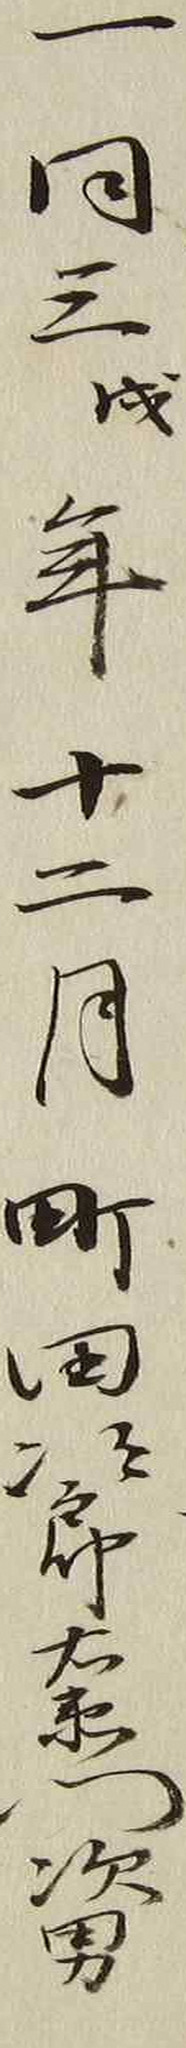一同三戌年十二月町田次郎右衛門次男
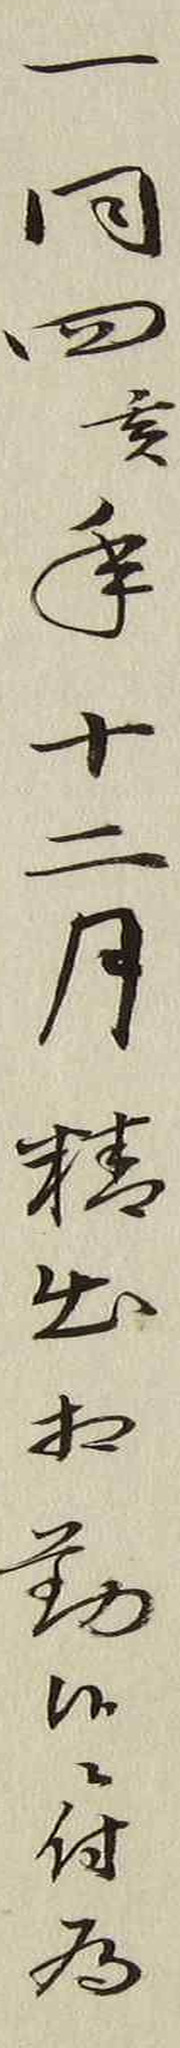一同四亥年十二月精出し相勤め候ニ付き
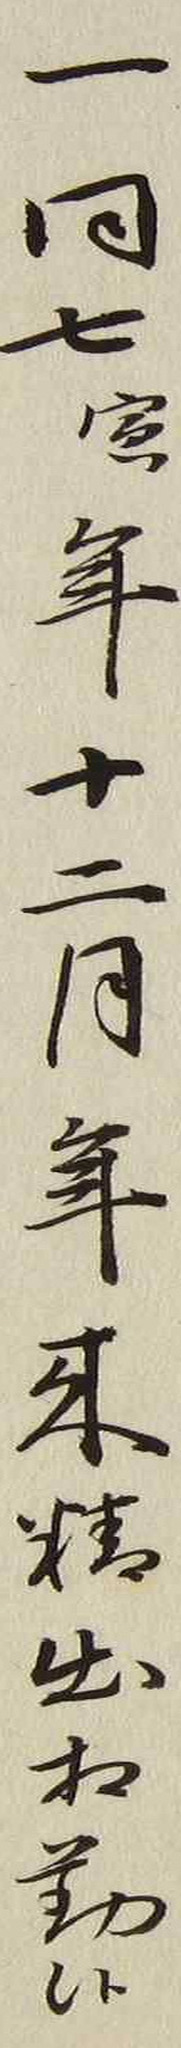一同七寅年十二月年来出精相勤め候
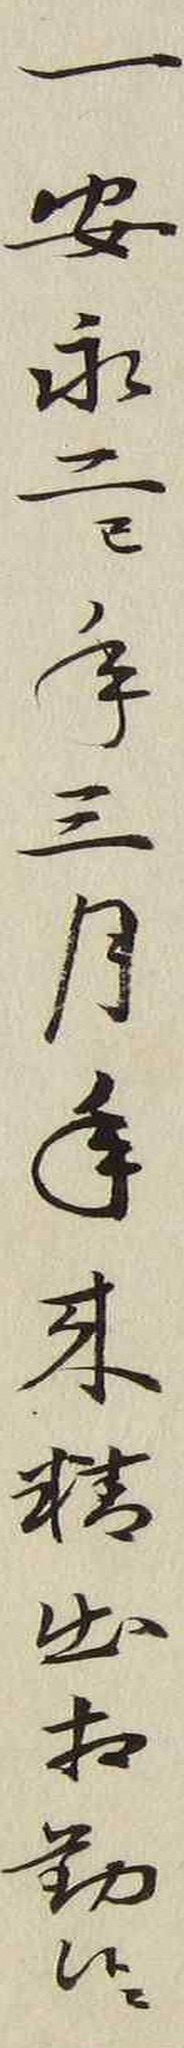一安永二巳年三月年来精出相勤め候ニ

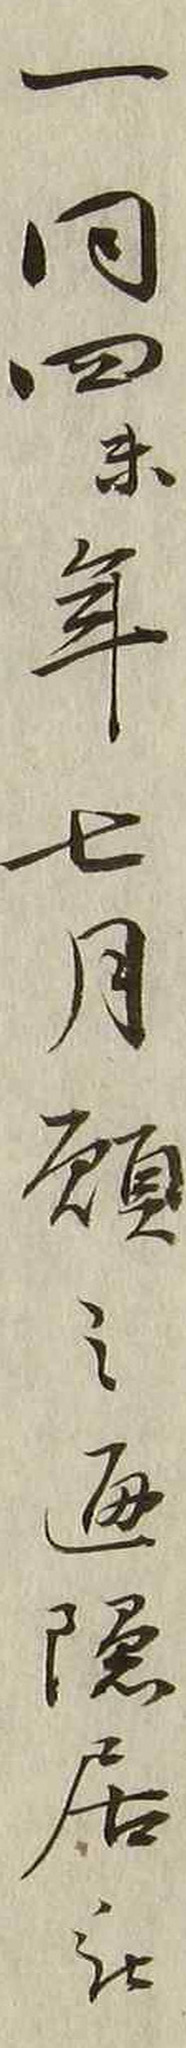一同四未年七月願之通り隠居
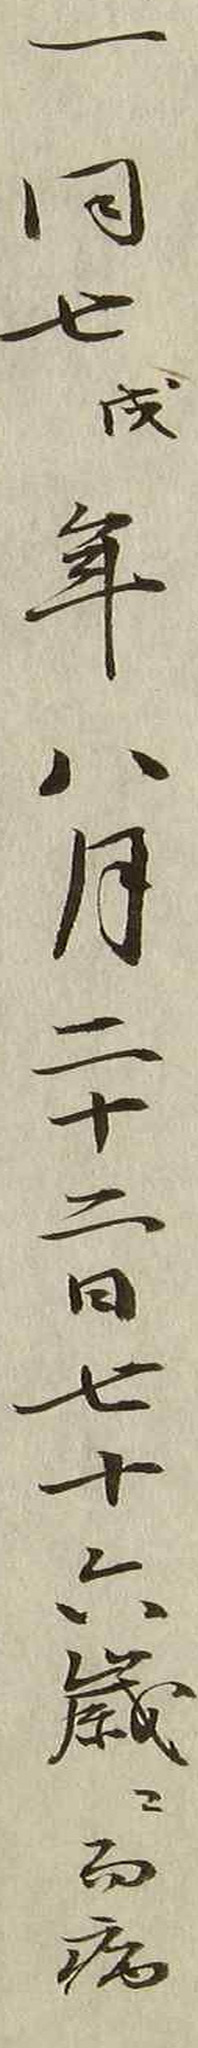一同七戌年八月二十二日七十六歳ニて病
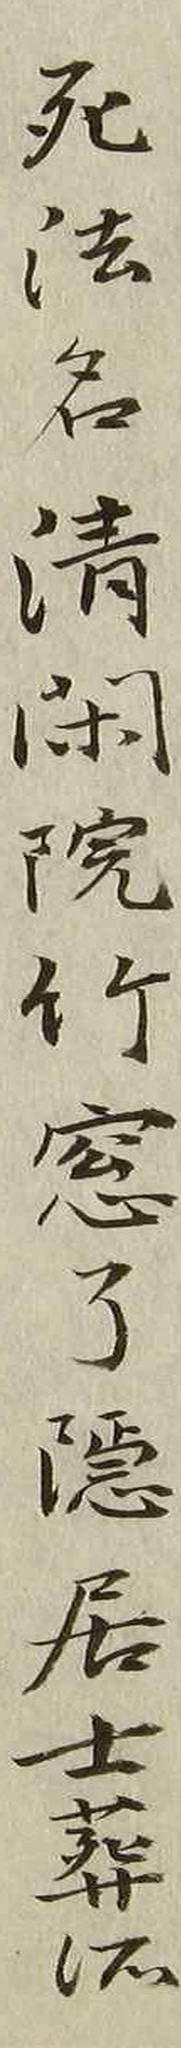死法名清閑院竹窓了隠居士葬所
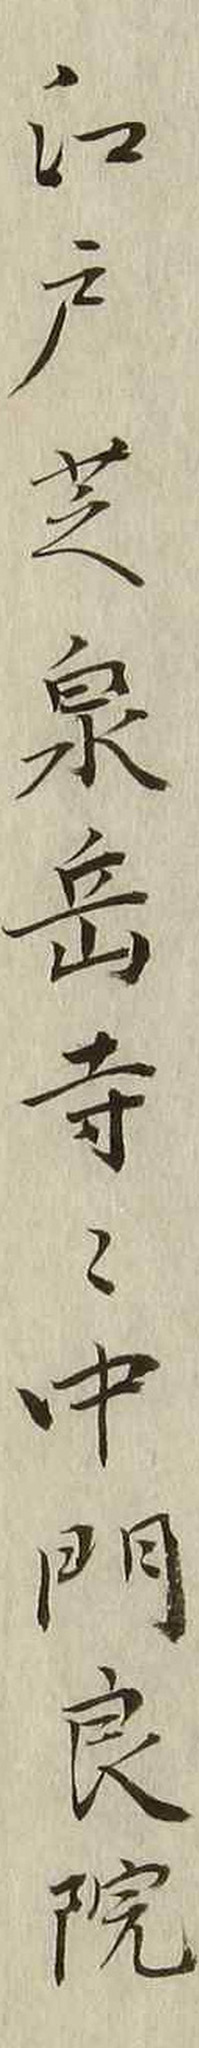江戸芝泉岳寺々な中門良院
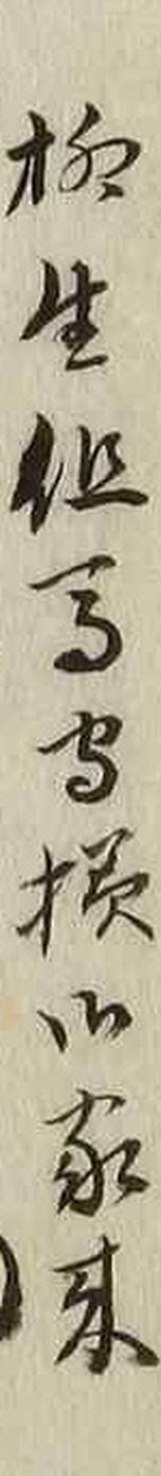女柳生但馬守様御家来
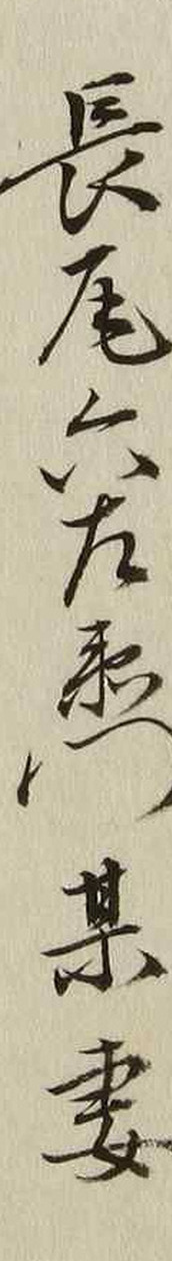長尾六左衛門某妻
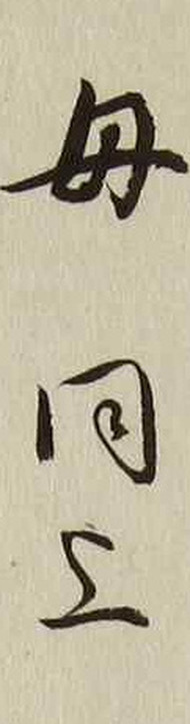母同上
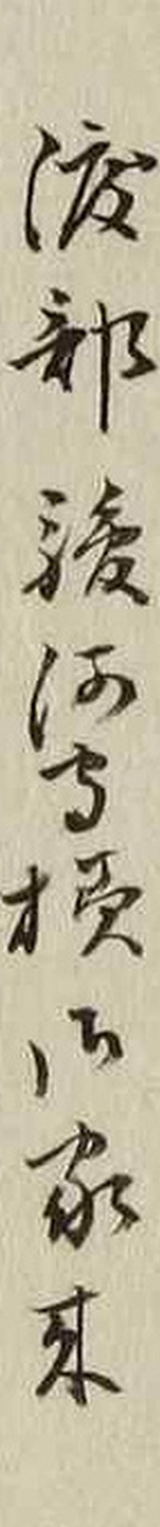渡部駿河守様御家来
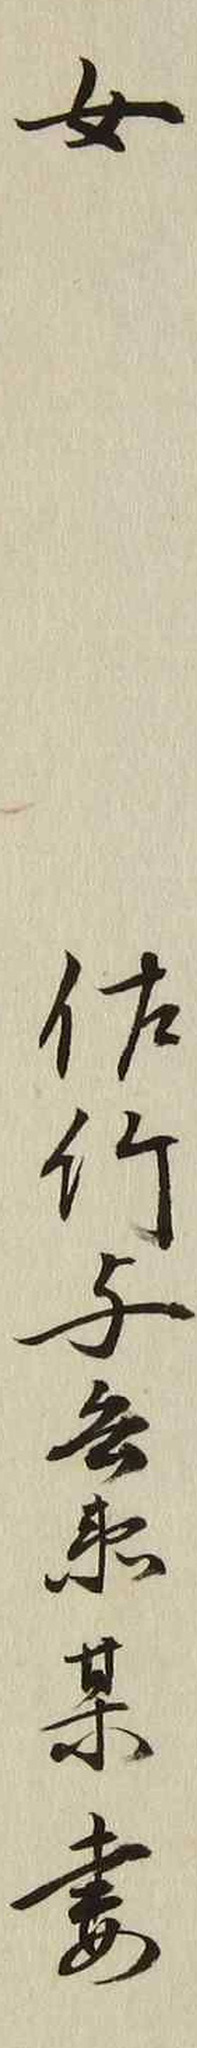女佐竹与兵衛某妻
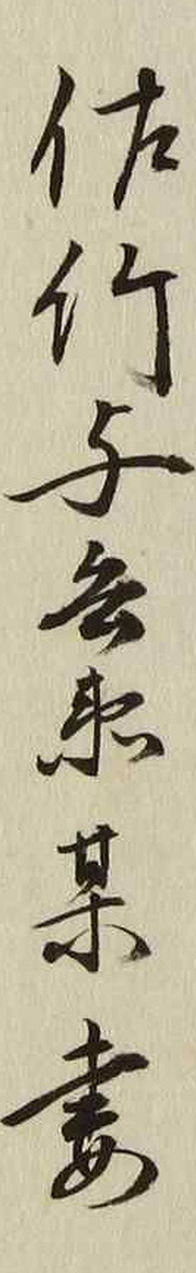女佐竹与兵衛某妻
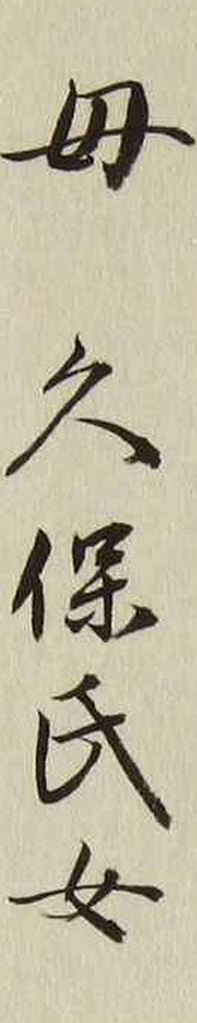母久保氏女
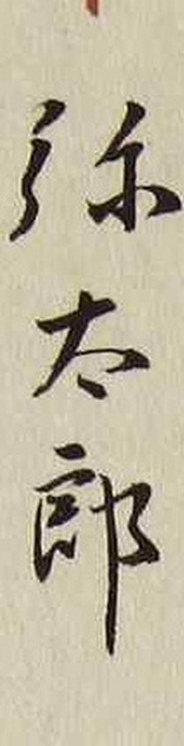弥太郎
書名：諸士系譜　巻之19　い之部19
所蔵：会津若松市立会津図書館
